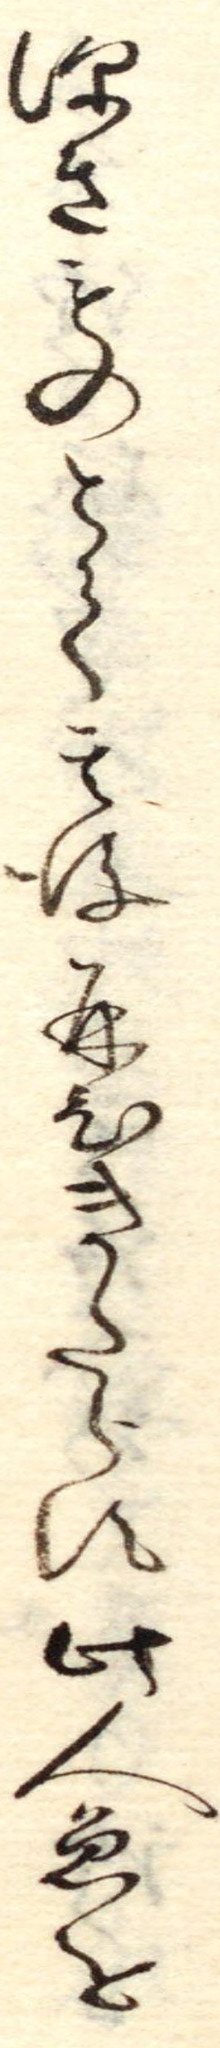深きものとて其後再ひきたらす此人魚を
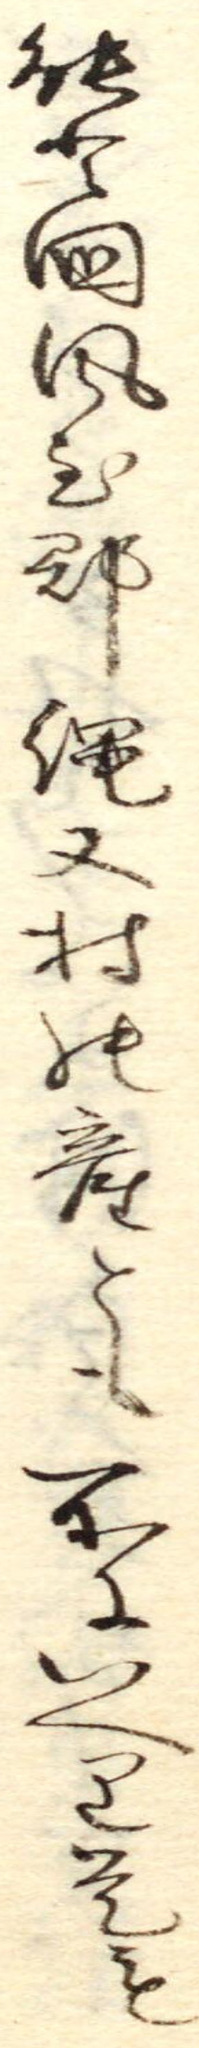能登国鳳至郡縄又村の産とも所にいへり是も
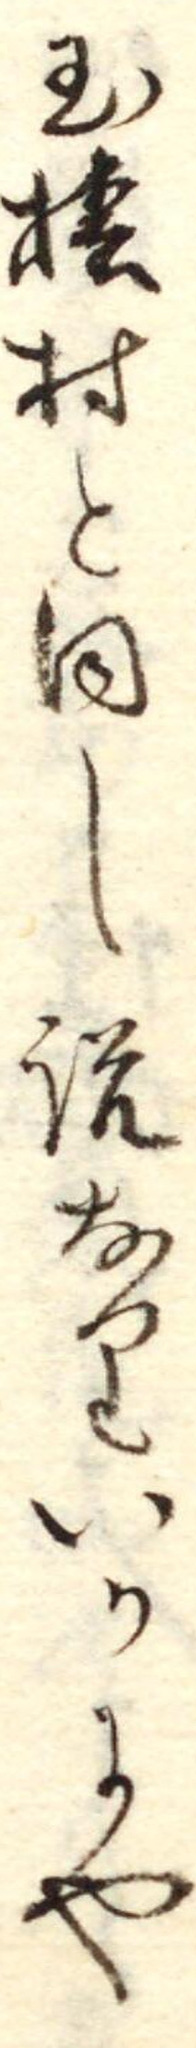玉椿村と同し説なりいかにや
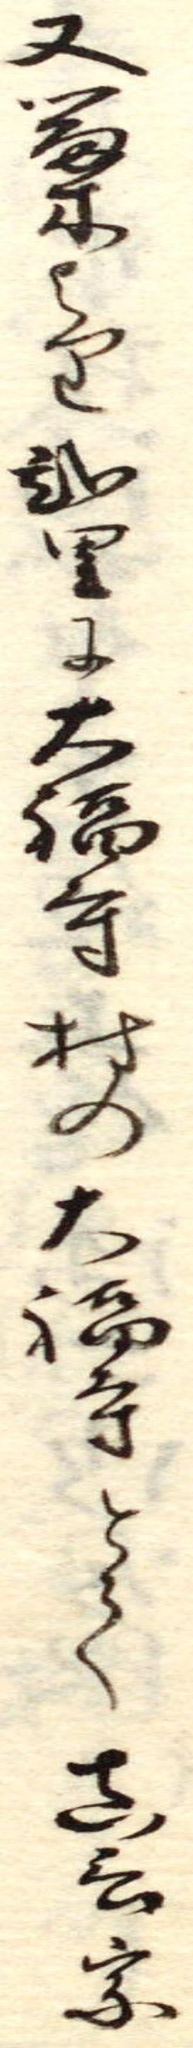又留木より弐里に大福寺村の大福寺とて真言宗
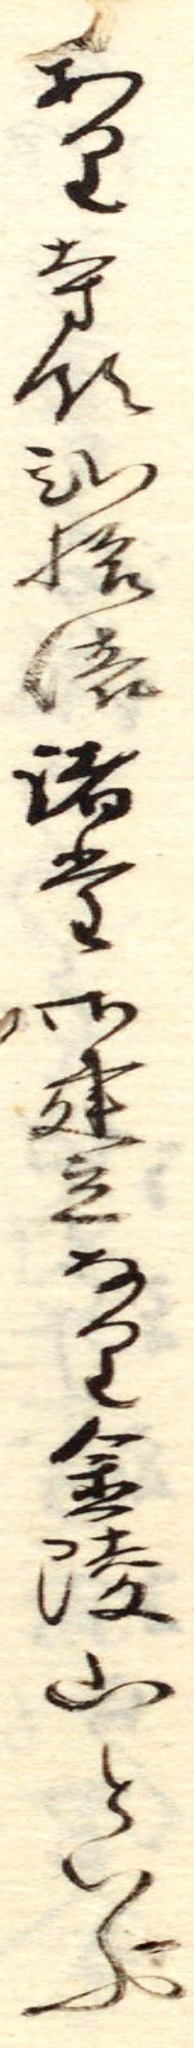あり寺領弐拾俵諸堂御建立なり金陵山といふ
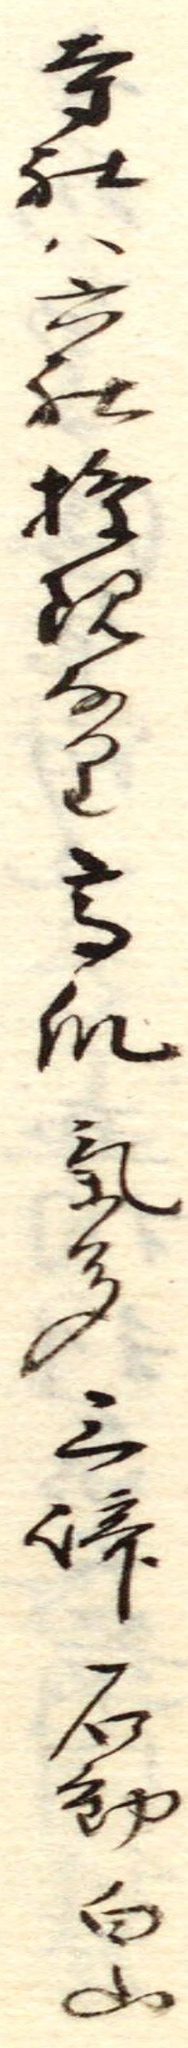寺社は六社権現なり高爪気多三崎石動白山
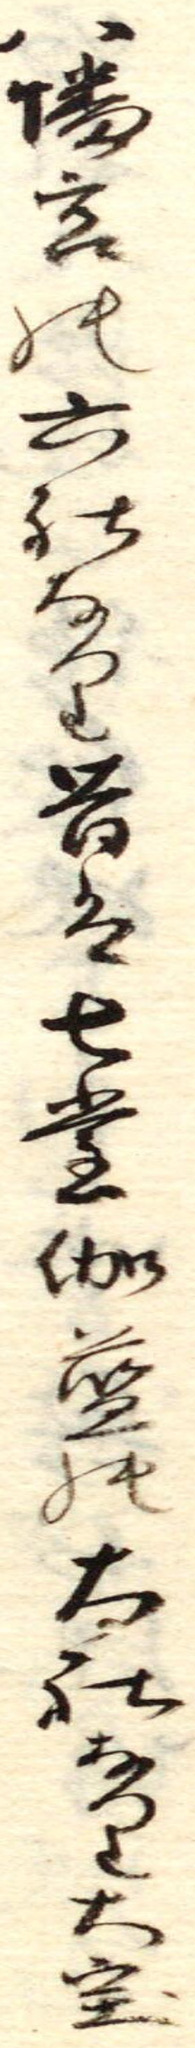八幡宮の六社なり昔は七堂伽藍の大社なり大宝
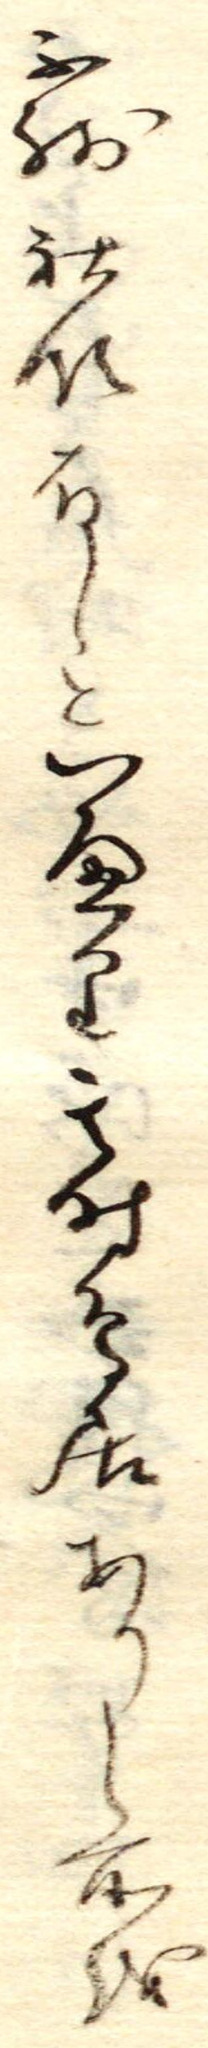不残社領有しといへり其時鳥居ありし所を

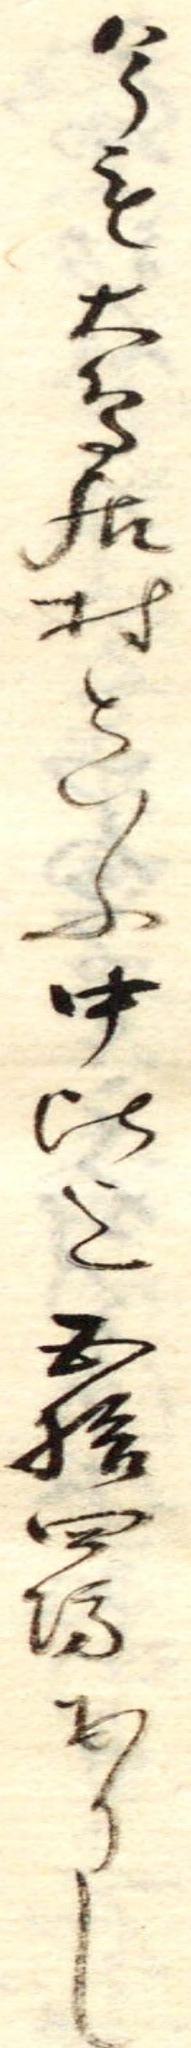今も大鳥居村といふ中比迄五拾四坊ありし
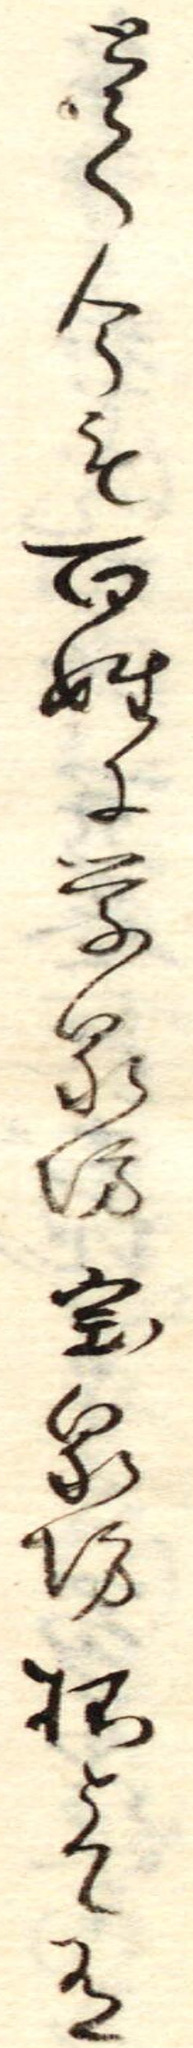とて今も百姓に学泉坊宝泉坊抔とて有
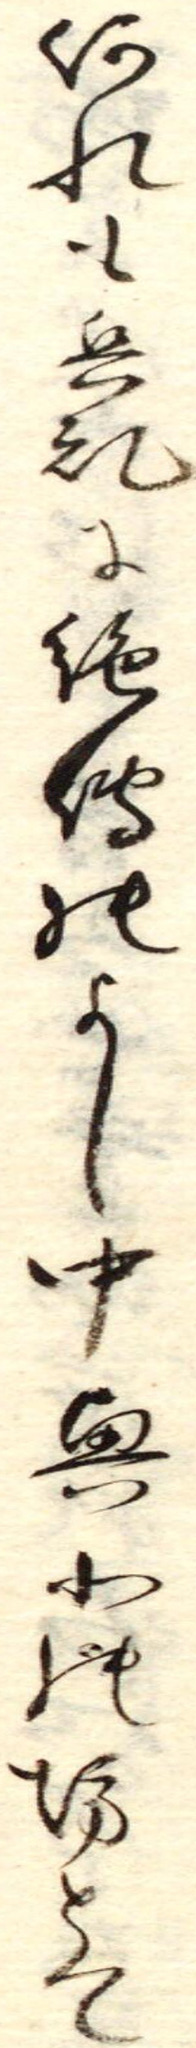何れも兵乱に絶伝のよし中興北の坊とて
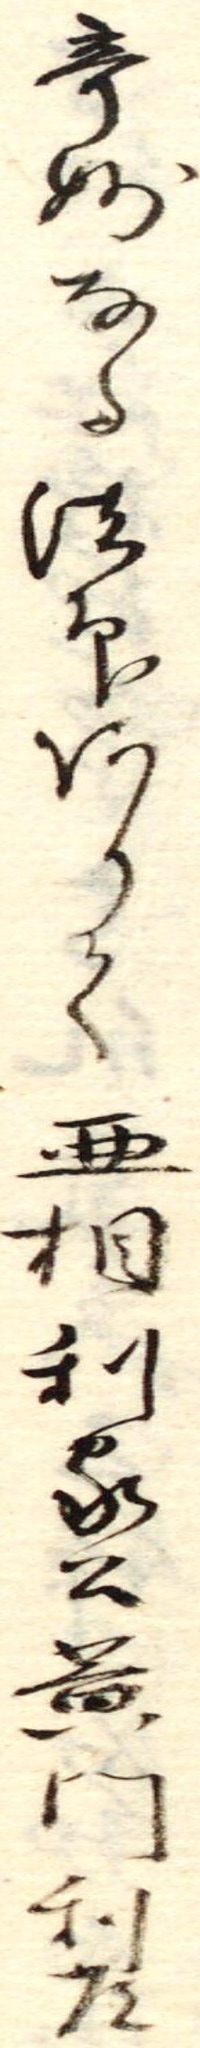奇妙なる法印ありて亜相利家黄門利常
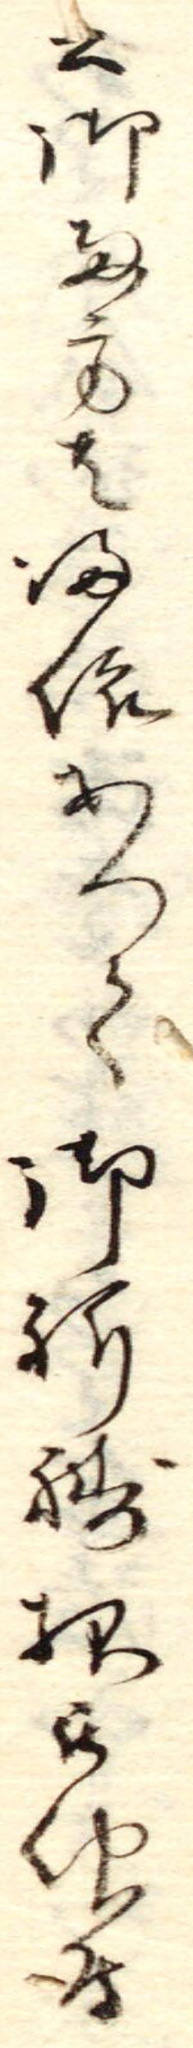公御両方共帰依あつて御祈祷抔被仰付
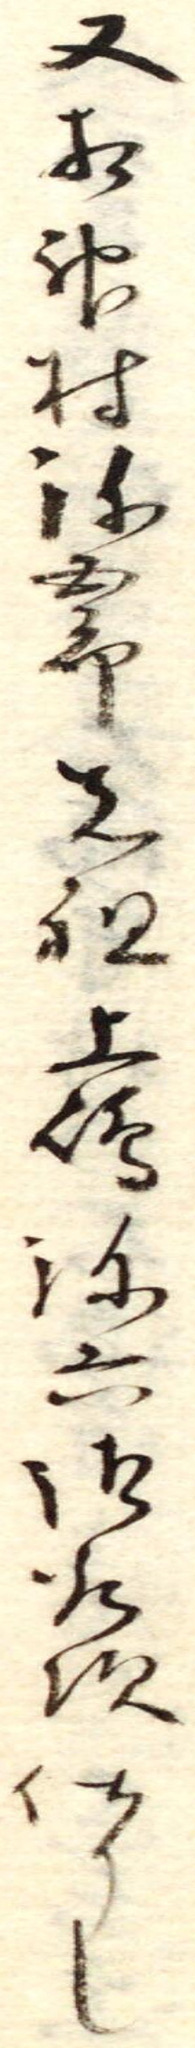又相神村弥五郎先祖上嶋弥六御取次仕りし
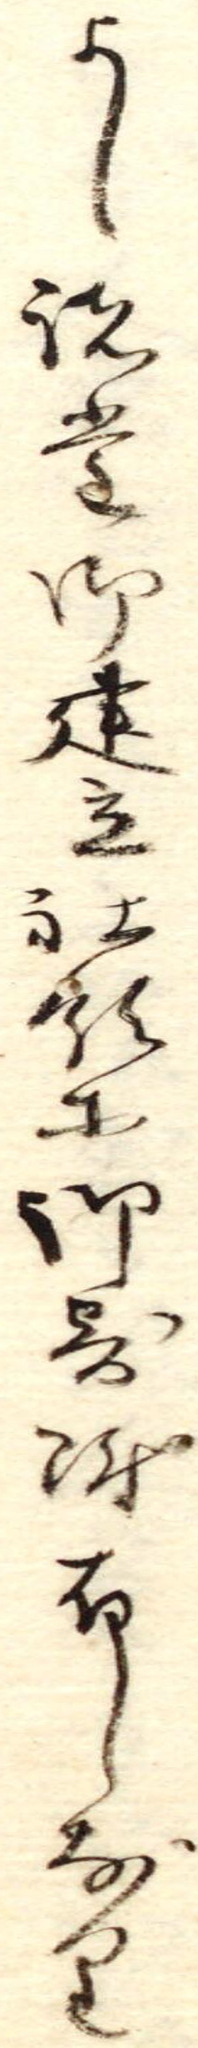よし諸堂御建立社領等御寄附有しなり
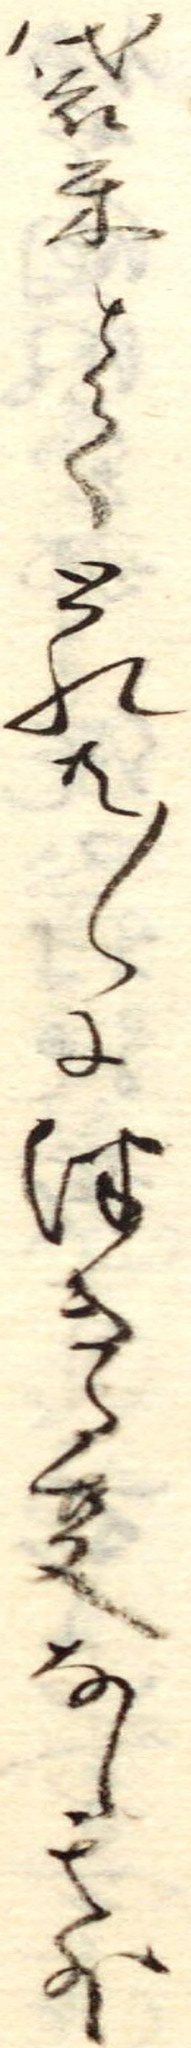袋米とれ共〳〵につきる事なし其外
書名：能登名跡誌
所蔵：Ishikawa Prefectural Library
